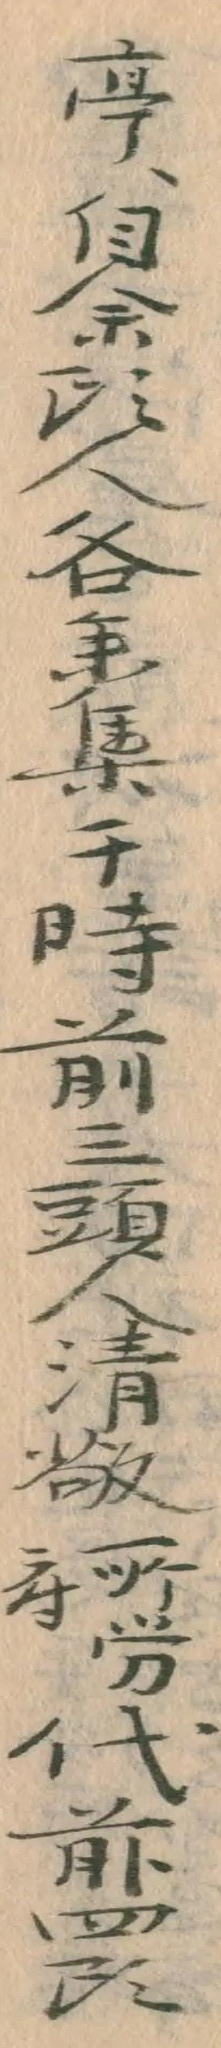亭ヘ自余頭人各参集于時前三頭人清敬所労ニ付代前四頭
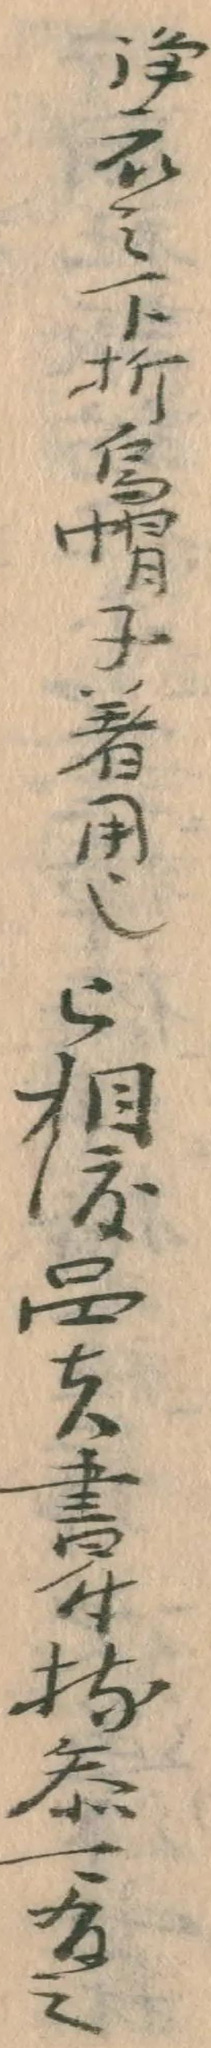浄衣之下折烏帽子着用也被相渡品者書付持参可有之
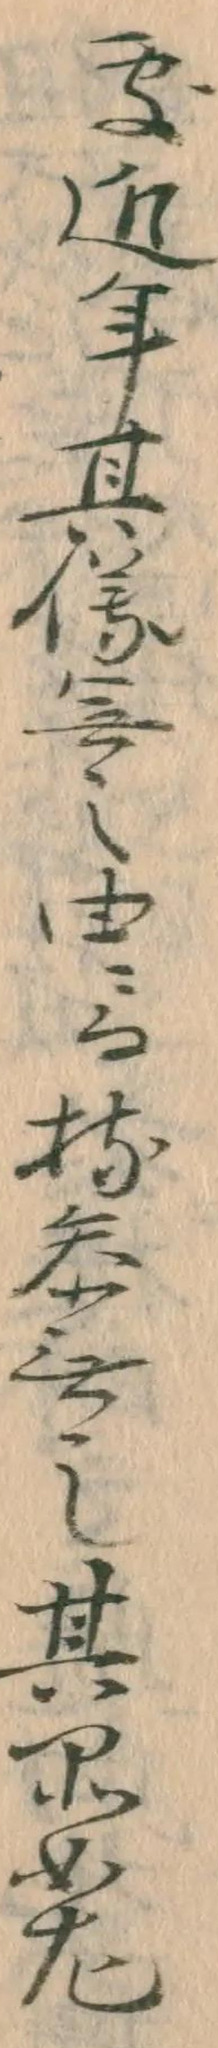處近年其儀無之由ニ而持参無之其品如左
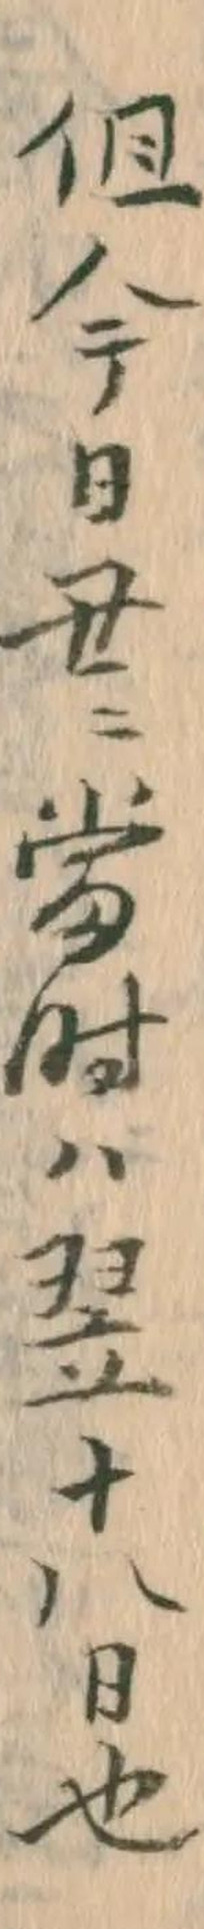但今日丑ニ當時ハ翌十八日也
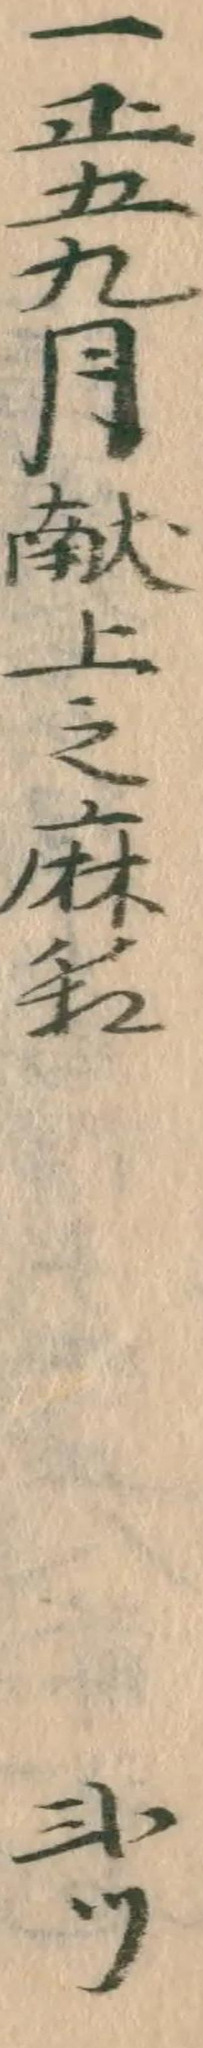一正五九月献上之麻箱壱ツ
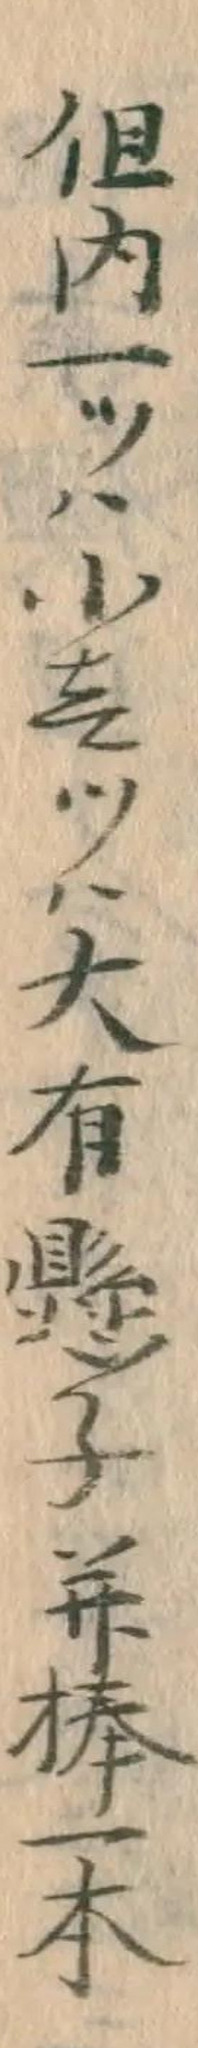但内一ツハ小壱ツハ大有懸子并棒一本
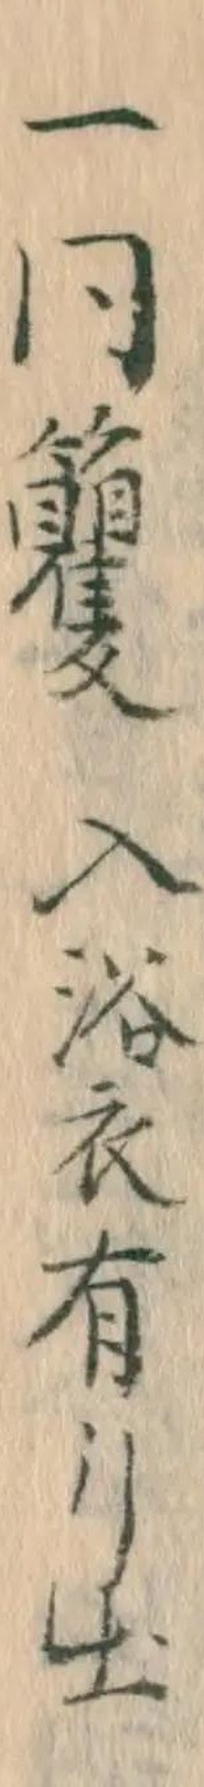一同籰入浴衣有引出

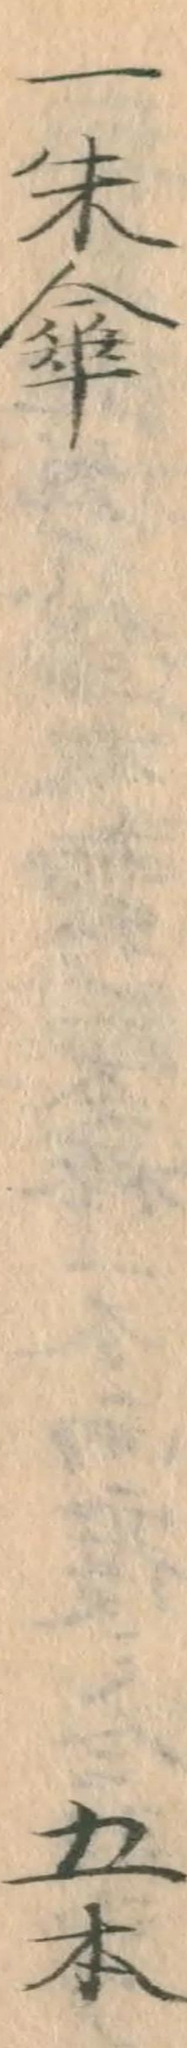一朱傘五本
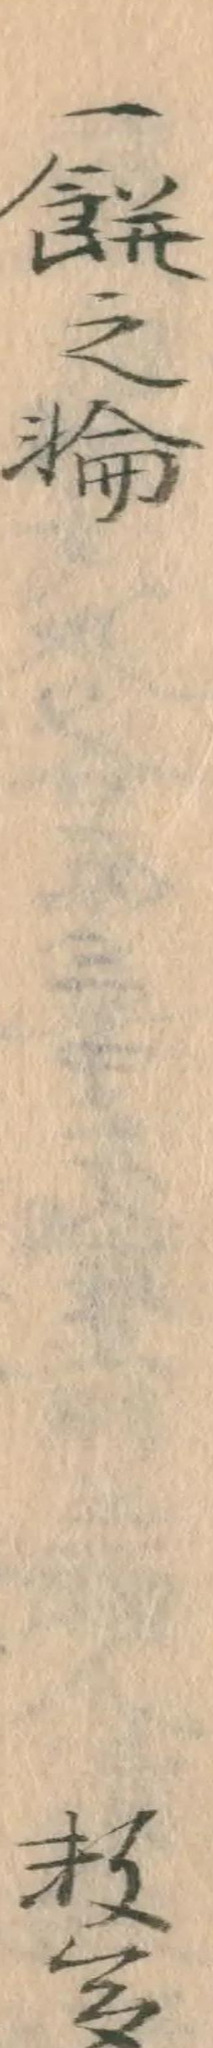一餅之輪数多
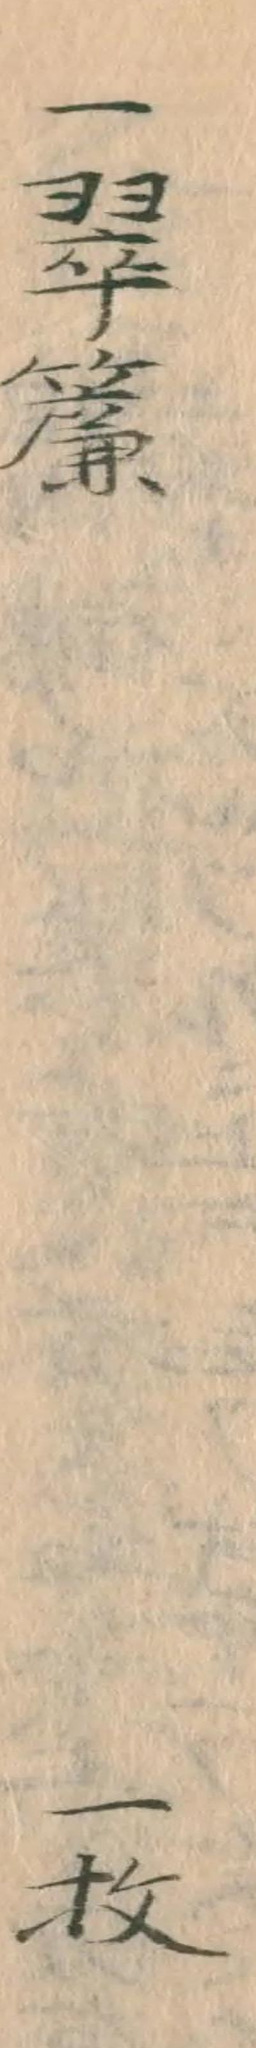一翠簾一枚
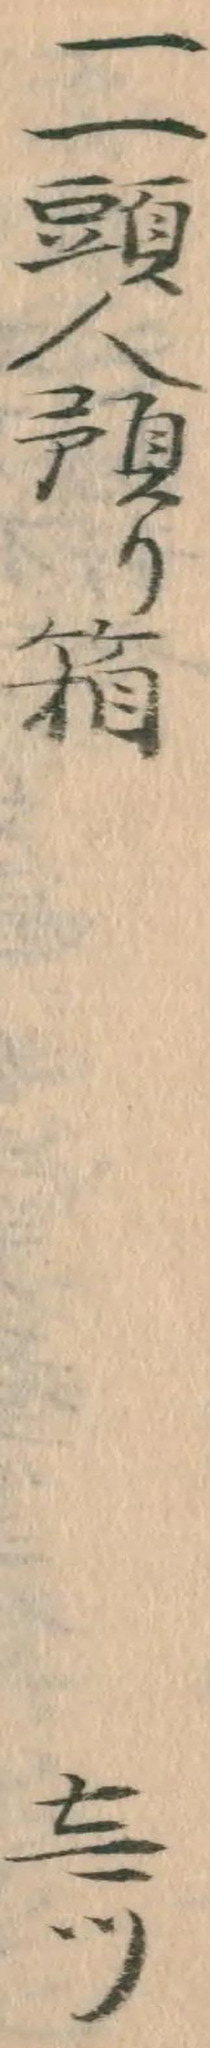一一頭人預り箱壱ツ
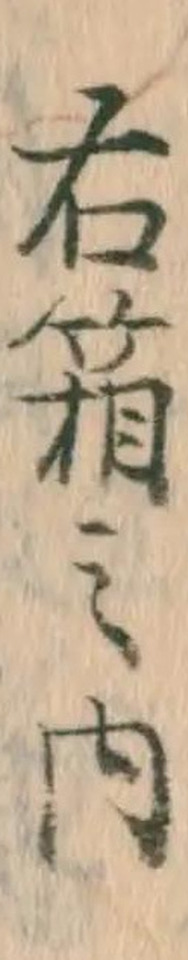右箱之内
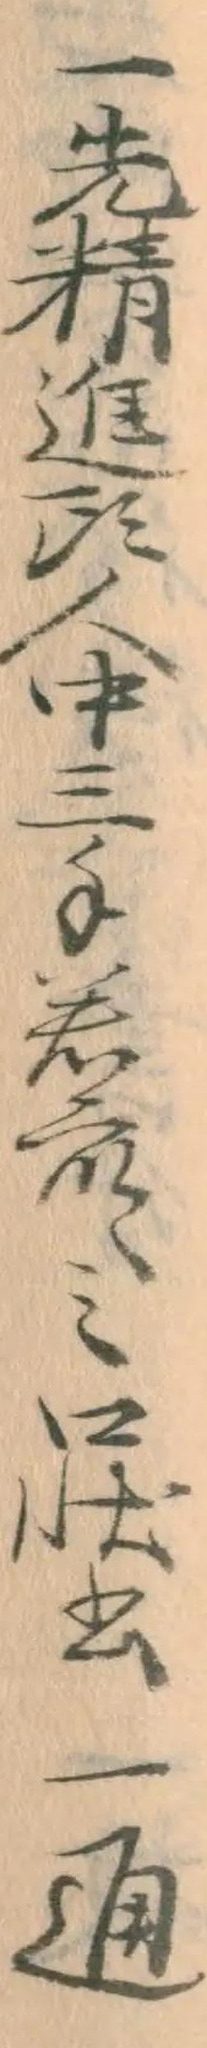一先精進頭人中三手若衆へ之口状書一通
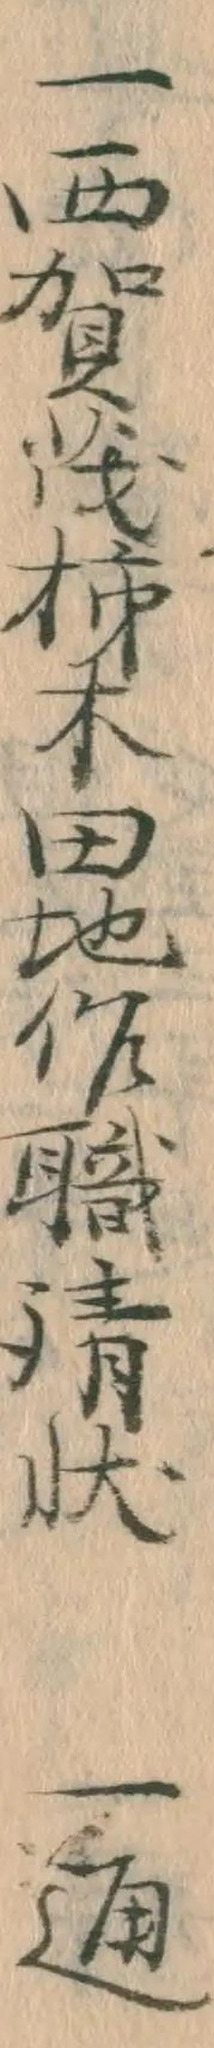一西賀茂柿木田地作職請状一通
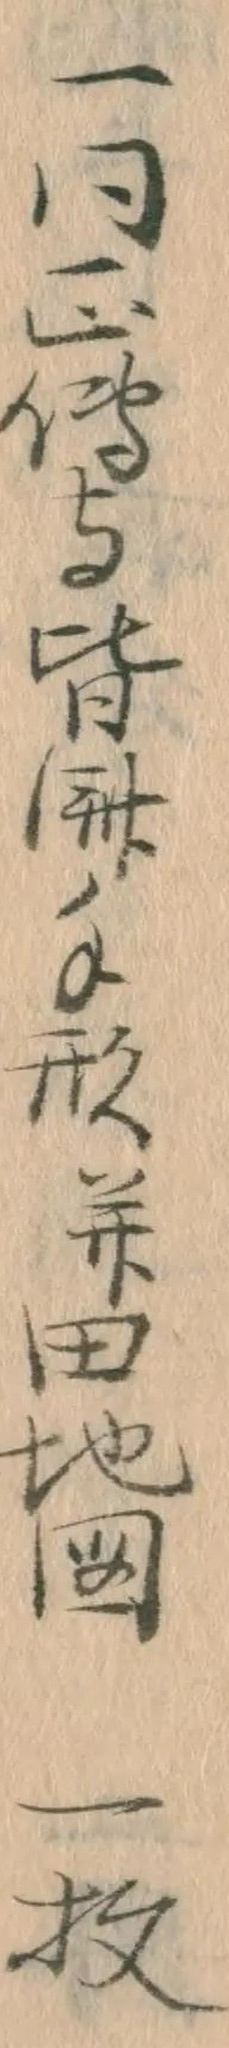一同正傳寺皆済手形并田地図一枚
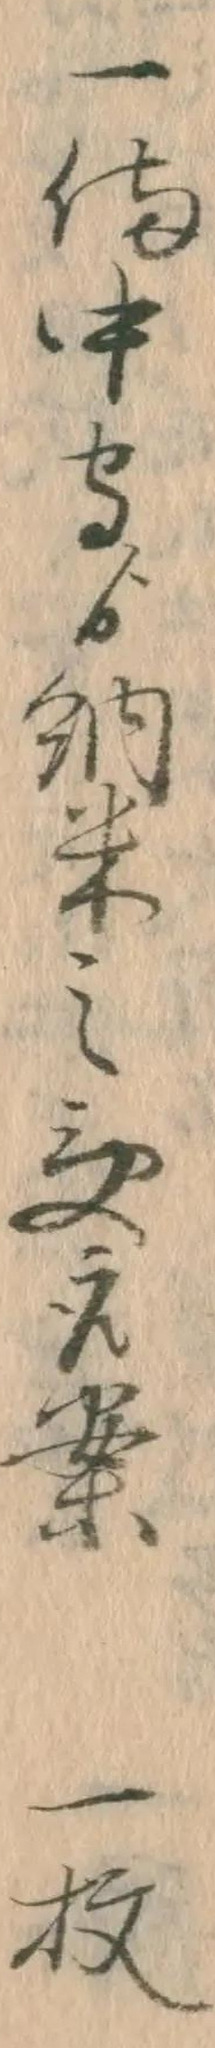一備中守ゟ納米之受取案一枚
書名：賀茂社記録. 第72冊
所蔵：国立国会図書館 National Diet Library, JAPAN
